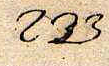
223
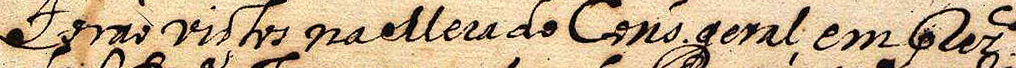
Foraõ vistos na Meza do Cons̄. geral, em prez.ca
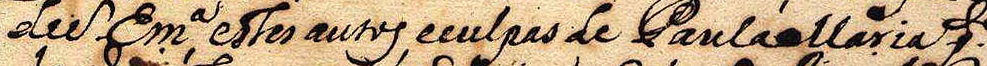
de S. Em.a, estes autos, e culpas de Paula Maria p.te
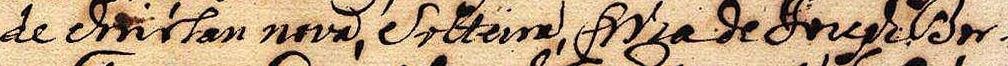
de christan nova, Solteira, filha de Iozeph Bor
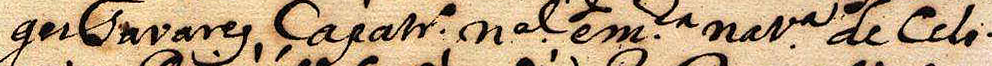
ges Tavares, Çapatr.o n.al e m.Ra na v.a de Celo
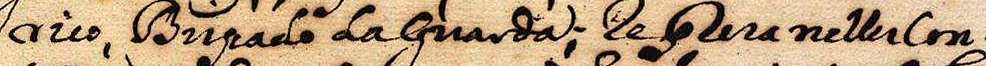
rico, Bispado da Guarda; Ré preza nelles Con
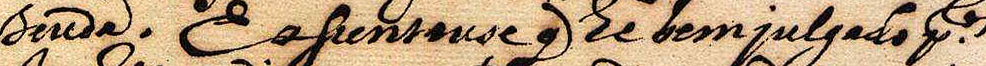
teuda. E assentouse q̄ he bem julgado p.los
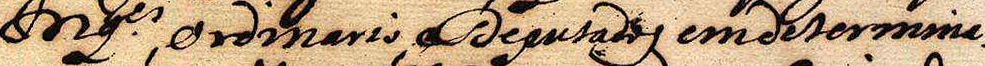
Inq.Res, ordinario, e Deputados em determina
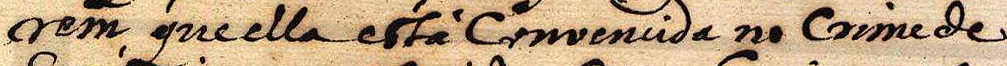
rem que ella está Convencida no Crime de
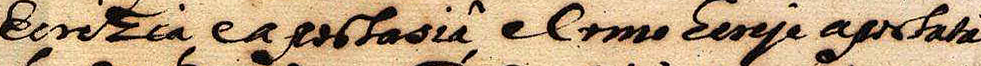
hereZia e apostasia, e Como hereje apostata
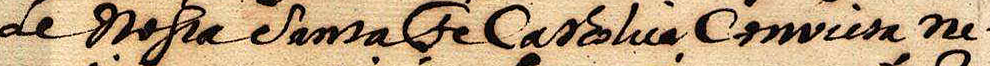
de Nossa santa Fé Catholica, Convicta ne
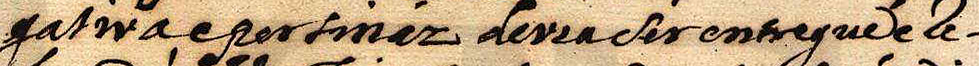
gativa, e pertinaz devia ser entregue, e Re
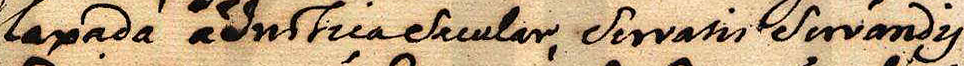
laxada a Iustiça Secular, Servatis Servandis
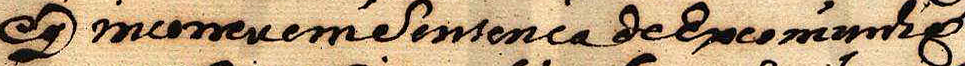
e q̄ incorreu em Sentença de Excom̄unhaõ
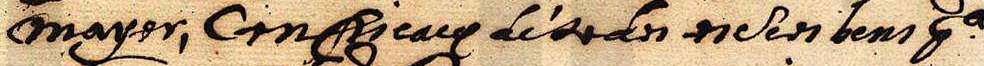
mayor, Confiscaçaõ de todos os Seos bens p.a
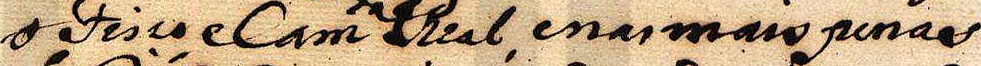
o Fisco e Cam.ra Real, e nas mais penas
